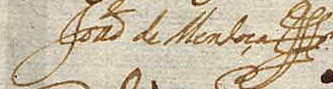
João de Mendoça
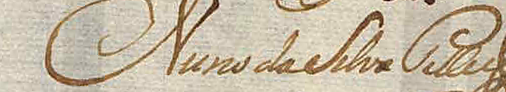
Nuno da Silva Telles
